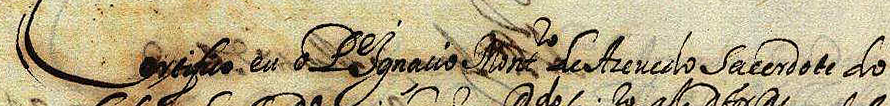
Certifico eu o P.e Ignacio Montro de Azeuedo Sacerdote do
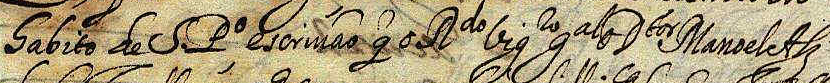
habito de S. Po, escriuão q̄ o Rdo Vigro gal o Dtor Manoel Alz̄
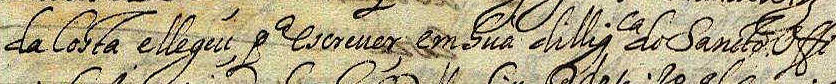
da Costa ellegeu, pa escreuer, em hūa dilligca do Sancto Offi
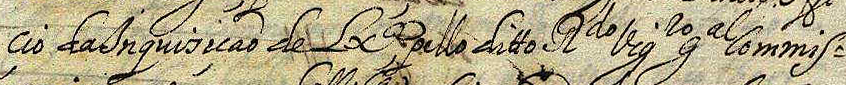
cio da Inquisiçaõ de Lxa, pello ditto Rdo Vigro gal Commis
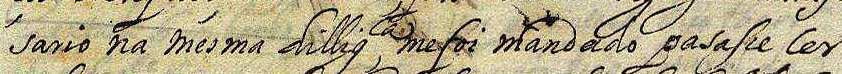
sario na mesma dilligca, me foi mandado pasasse cer
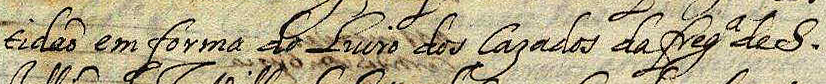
tidaõ em forma do Liuro dos Cazados da frega de S.
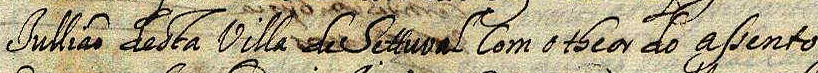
Iullião desta Villa de Settuval com o theor do assento
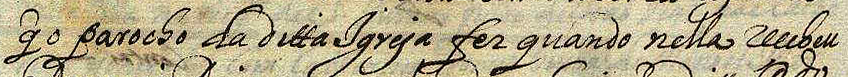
q̄ o parocho da ditta Igreja fez quando nella recebeu
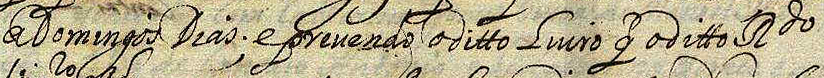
a Domingos Dias; e preuendo o ditto Liuro q̄ o ditto Rdo
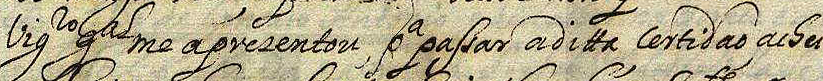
vigro gal me apresentou, pa passar a ditta certidaõ, achei
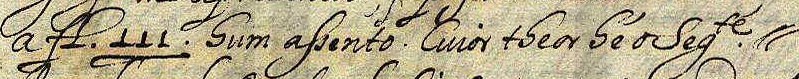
a fL. 111. hum assento. Cuior theor he o segte. //
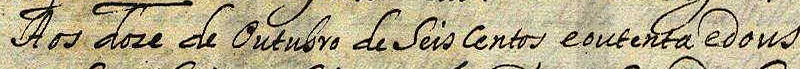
Aos doze de Outubro de Seiscentos e outenta e dous
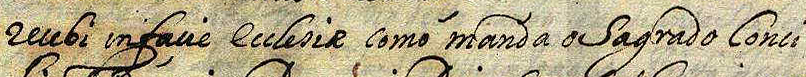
recebi in facie ecclesiæ como manda o Sagrado Conci
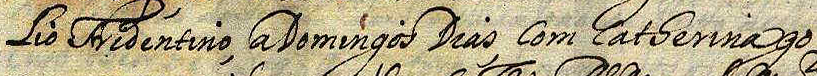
Lio Tridentino, a Domingos Dias, com Catherina go
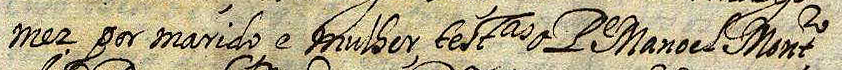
mez por marido, e mulher, testas o Pe Manoel Montro
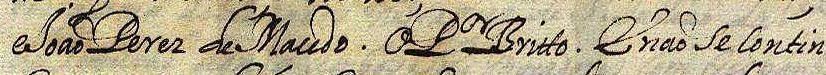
e Ioaõ Perez de Macedo. O Por Britto. E naõ se contin
